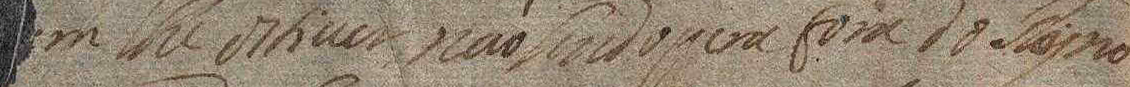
em lhe estiuer, naõ hindo pera fora do Rejno
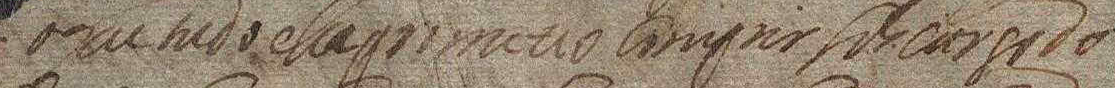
o que tudo ella prometeo comprir sob cargo do
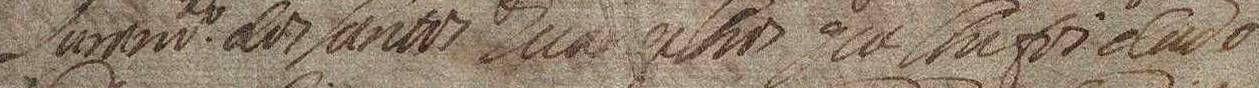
Iuram.to dos santos Euangelhos que lhe foi dado
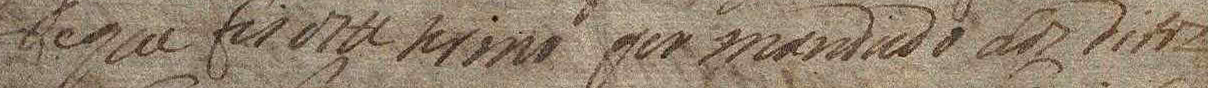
De que fis este termo per mandado dos ditos
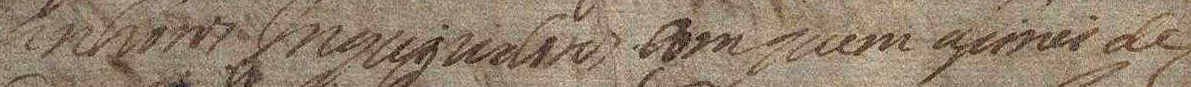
senhores Inquisidores com quem assinei de
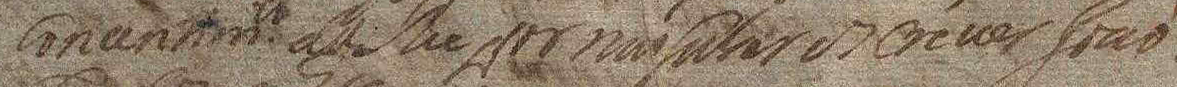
concentim.to da Ree por naõ saber escreuer Joaõ
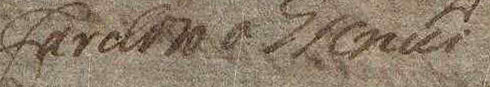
Cardozo o Escreui
